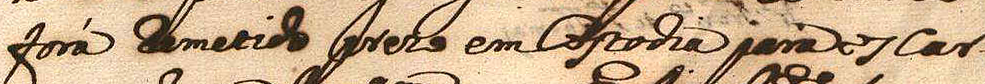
fora Remetido prezo em Costodia para os car
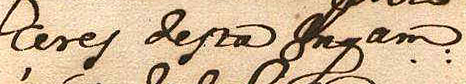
ceres desta Jnq.am:
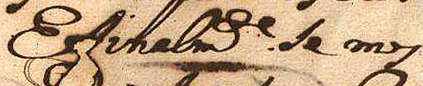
E finalm.te se mos
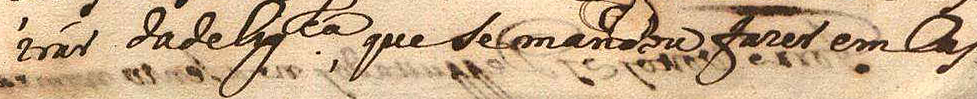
trar da delig.ca, que se mandou fazer em Cas
